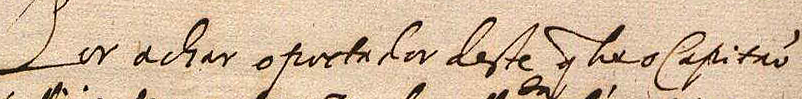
Por achar o portador deste q̄ he o Capitaõ
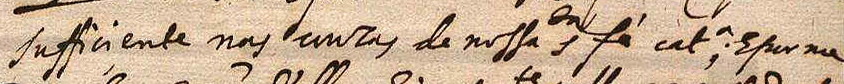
sufficiente nas couzas de nossa sta fé cata; E por me
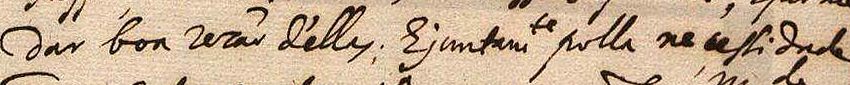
dar boa rezão d'ellas; E juntamte polla necessidade
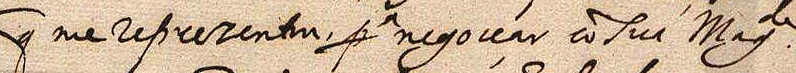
q̄ me Reprezentou, ꝑa negocear cō sua Magde.
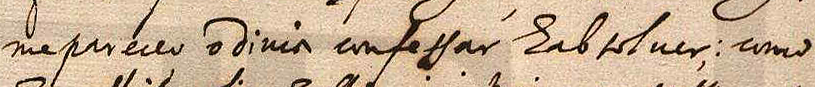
me pareceo o diuia confessar E absoluer; como
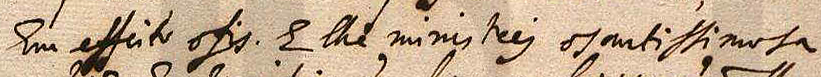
Em effeito o fis. E lhe ministrej o santissimo sa
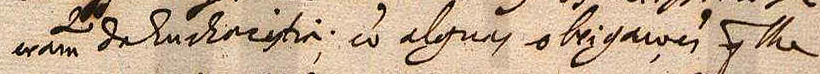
cramto da Eucharistia; cō alguas obrigaçoẽs q̄ lhe
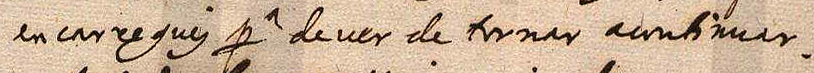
encarreguej ꝑa deuer de tornar a continuar
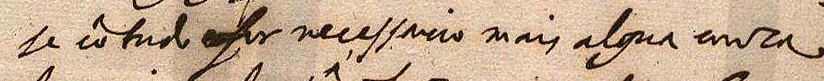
se cōtudo o for necessario mais algua couza
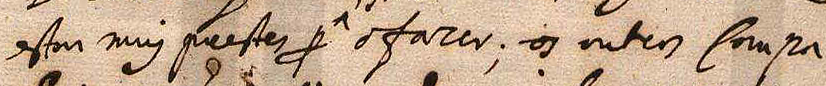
estou muj prestes ꝑa o fazer; os outros Compa
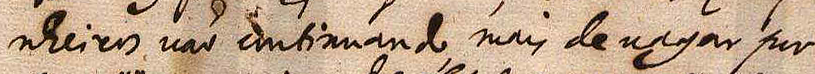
nheiros uaõ continuando, mais deuagar por
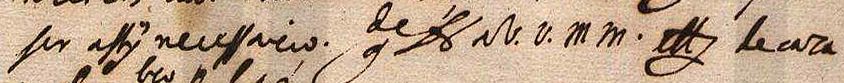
ser assȳ necessario; gde Ds a V.v. mm. ettꝭ de caza
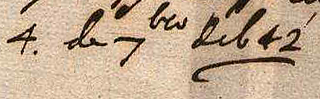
4. de 7bro de 642
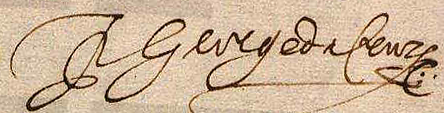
fr George da Cruz
